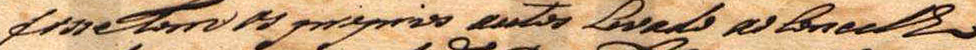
fosse Com os proprios autos Levado ao Concelho
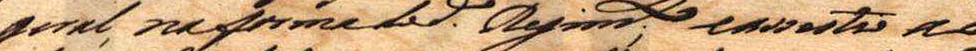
geral, na forma do d.o Regim.to; e assestio ao
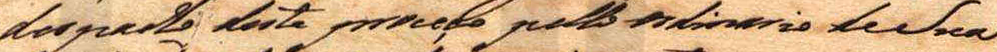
despacho deste proceço pello ordinario de Sua
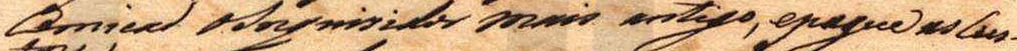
Comiçaõ o Inquizidor mais antigo, e pague as Cus
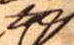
tas
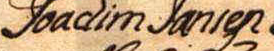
Ioachim Iansen
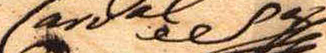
Carval e Sa
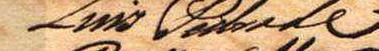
Luiz Pedro de
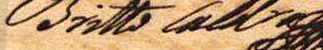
Britto Caldra
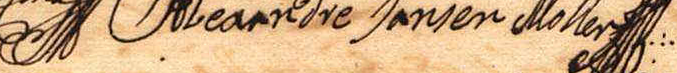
Alexandre Janser Moller
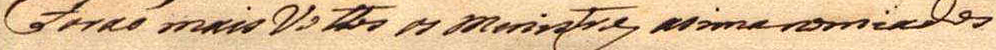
Foraõ mais Vottos os Menistros asima nomiados
